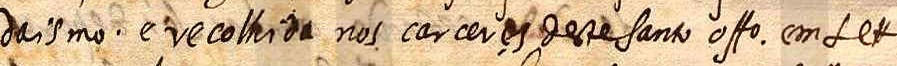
daismo. e recolhida nos carceres deste santo offo. em sette
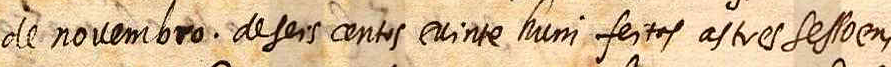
de nouembro de seiscentos e uinte hum feitas as tres sessoens
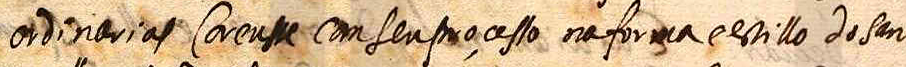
ordinarias Coreusse com seu processo na forma e estillo do san
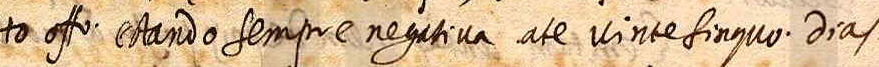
to offo estando sempre negatiua ate uinte sinquo dias
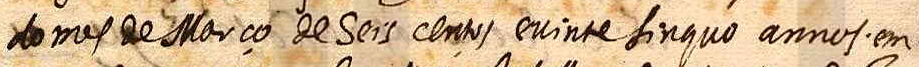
do mes de Março de Seiscentos e uinte sinquo annos em
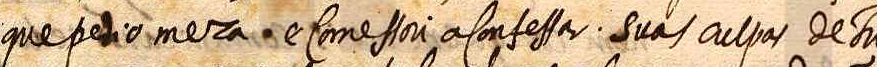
que pedio meza e Comessou a Confessar suas culpas de Iu
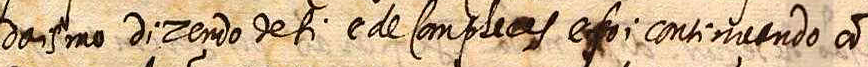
daismo dizendo de si e de Compleces e foi continuando cō
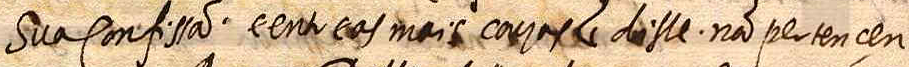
Sua Confissā e entre as mais couzas q̄ disse nā pertencen
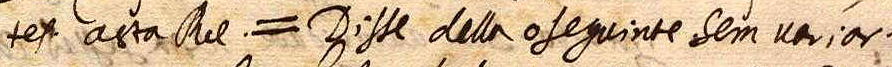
tes a esta Ree = Disse della o seguinte sem uariar
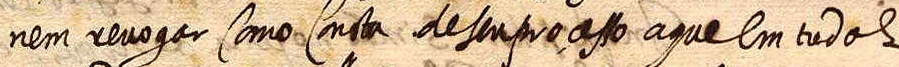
nem reuogar Como Consta de seu processo a que em tudo E
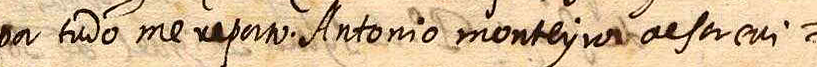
por tudo me reporto. Antonio monteyro o escreui
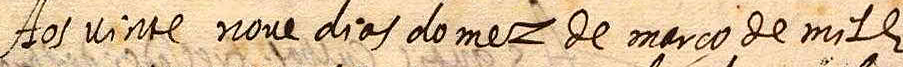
Aos uinte noue dias do mez de março de miL E
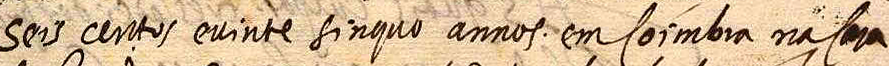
seiscentos e uinte sinquo annos em Coimbra na Caza
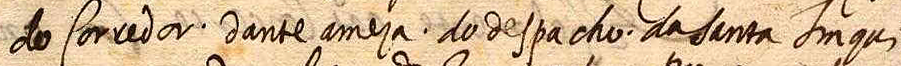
do Corredor dante a meza do despacho da santa Imqui
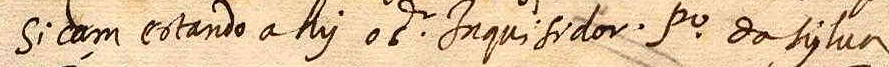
Siçam estando ahy o sor. Inquisidor po. da sylua
